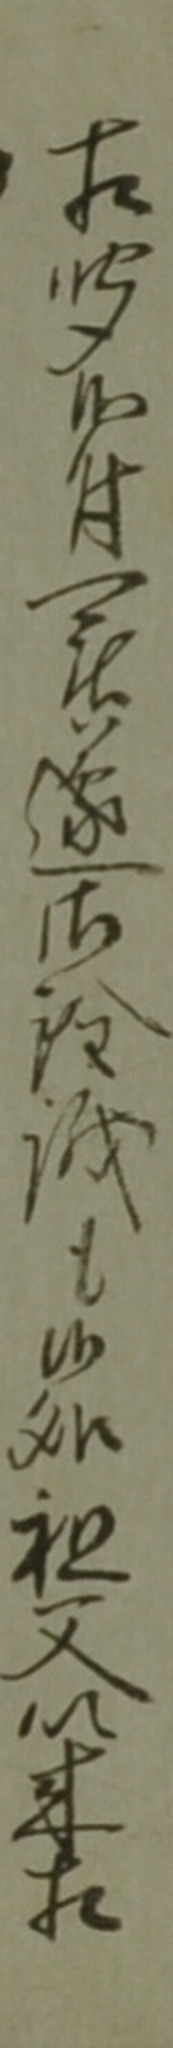相聞候付可被遂詮議も候処祖父以来相
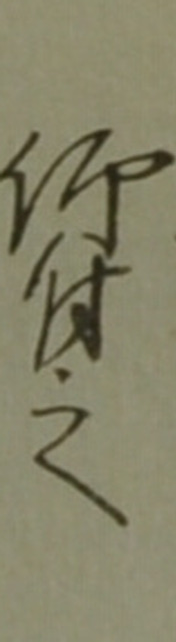仰付之
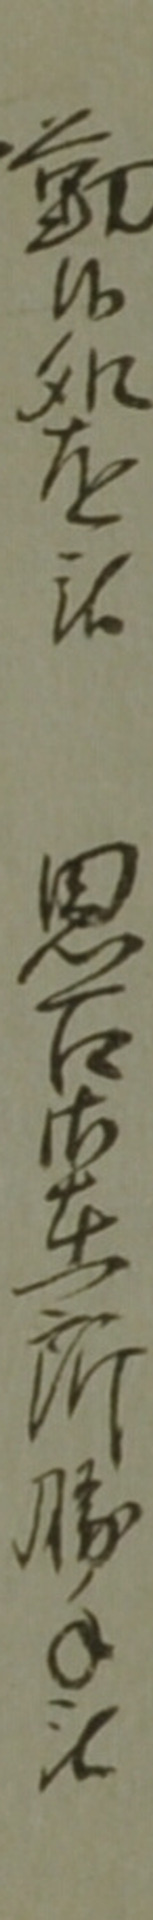勤候処を被思召御在所勝手被
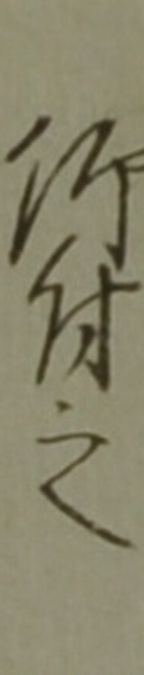仰付之
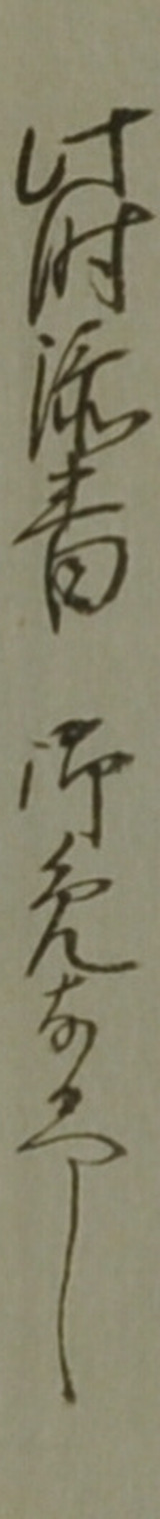此時添番御免なるべし
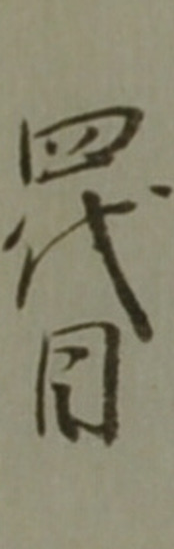四代目
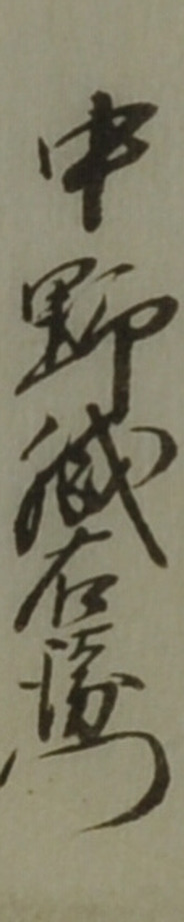中野緘右衛門
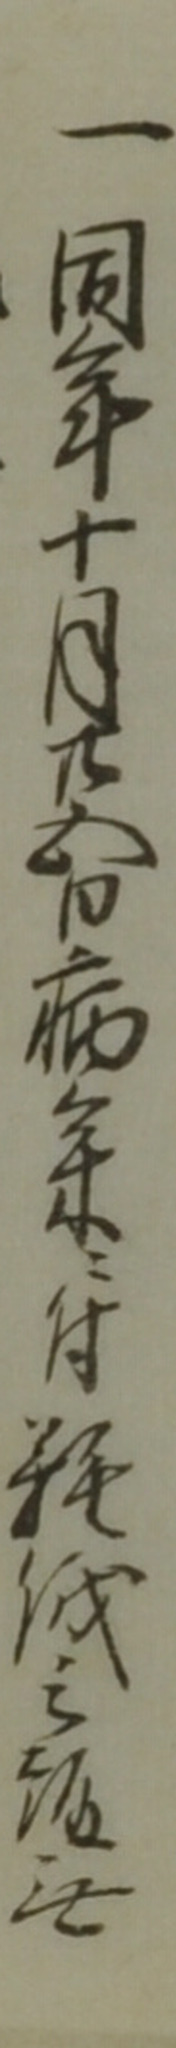一同年十月廿五日病気に付難儀之趣無
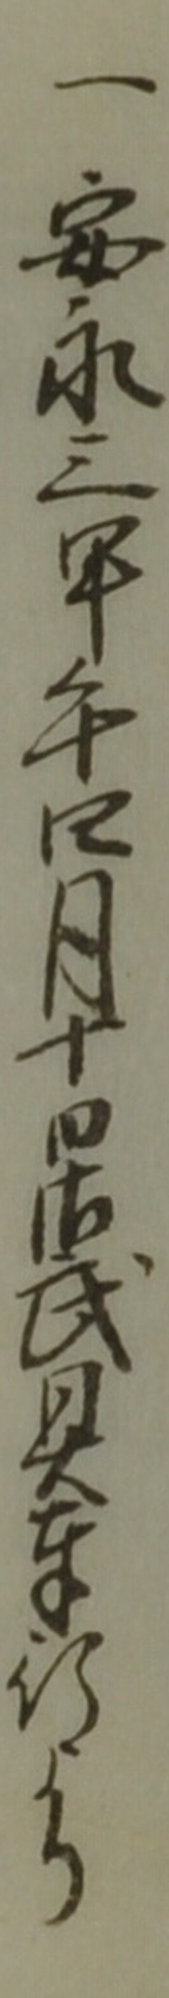一安永三甲午四月十四日御武具奉行より
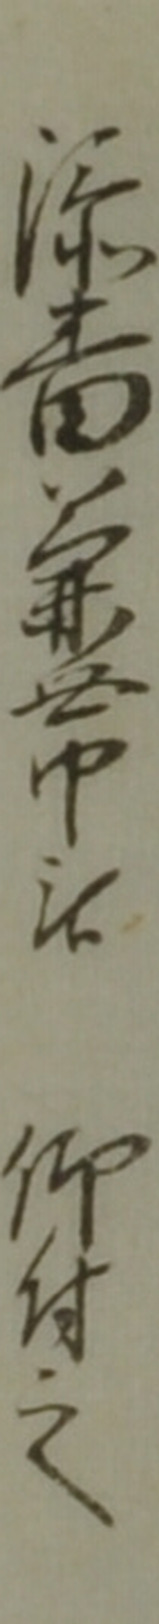添番兼帯被仰付之
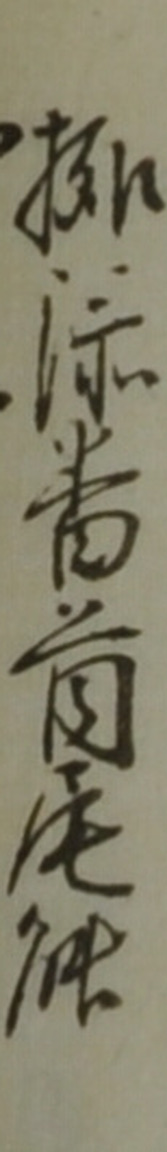拠添番首尾能
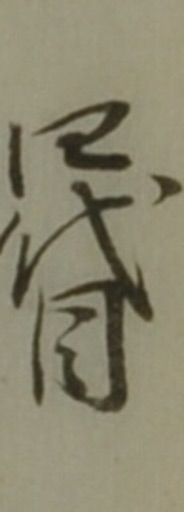四代目
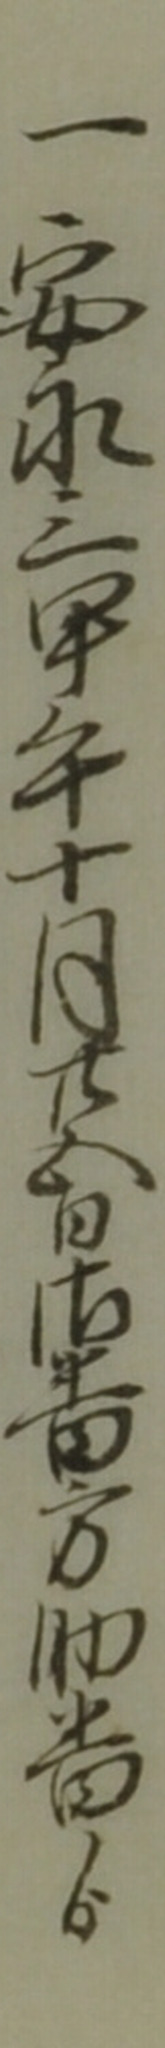一安永三甲午十月廿五日御番方助番より
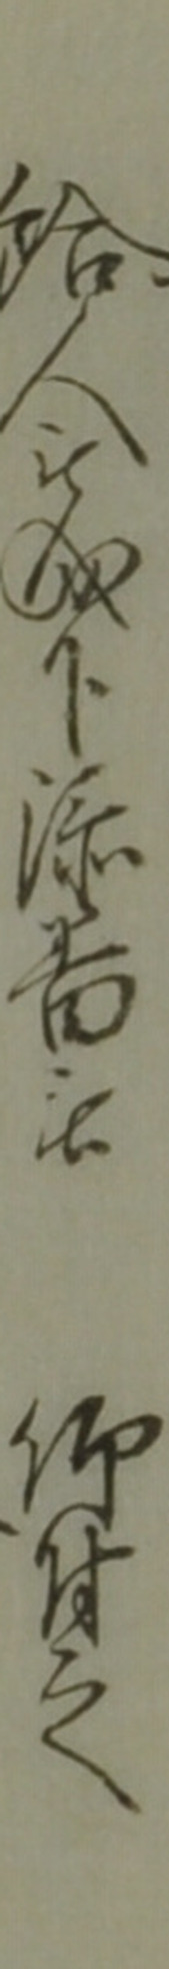給人被成下添番被仰付之
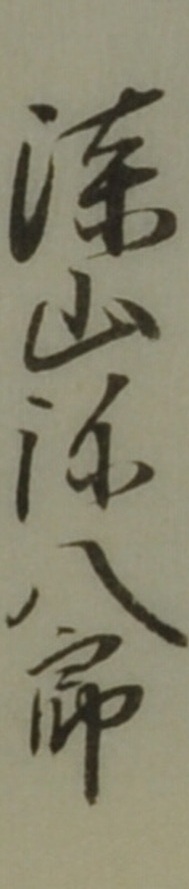漆山弥八郎
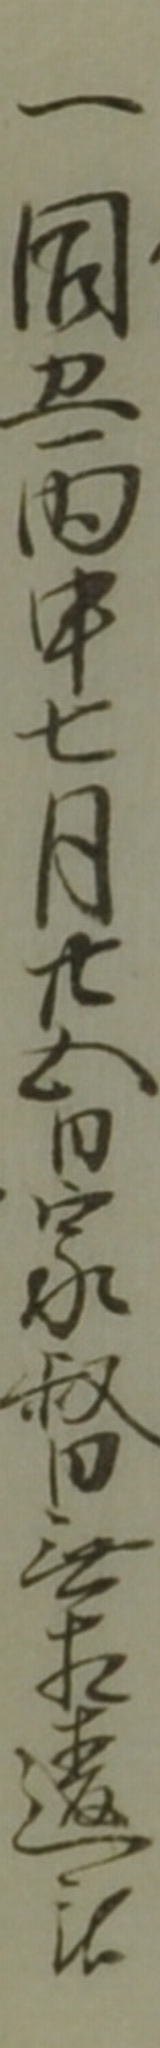一同五丙申七月廿五日家督無相違被
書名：諸御役代々録（八）
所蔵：伊那市立高遠町図書館・合同会社AMANE
